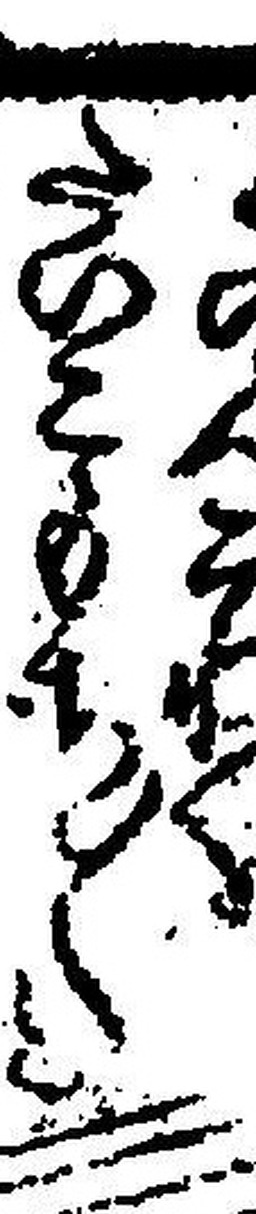たいこもち〳〵と
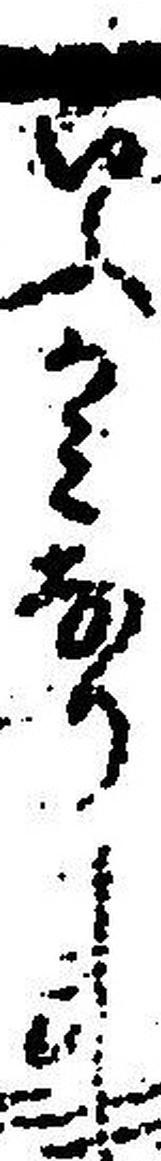いふかみなり
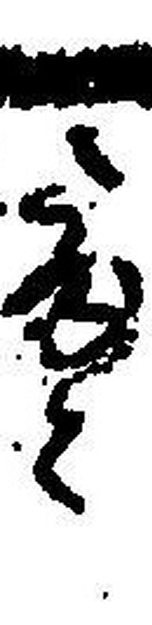さまと
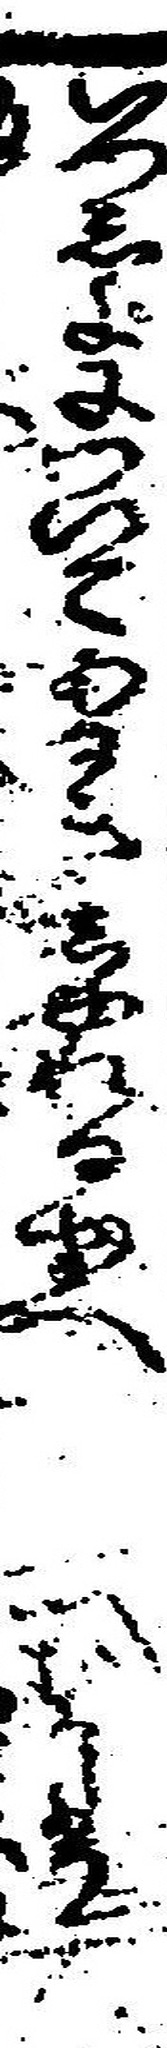いつしよについてあるきしやれるゆへ
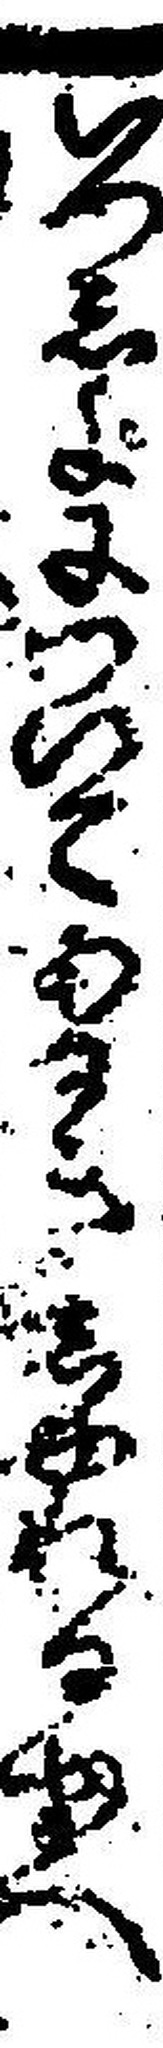いつしよについてあるきしやれるゆへ
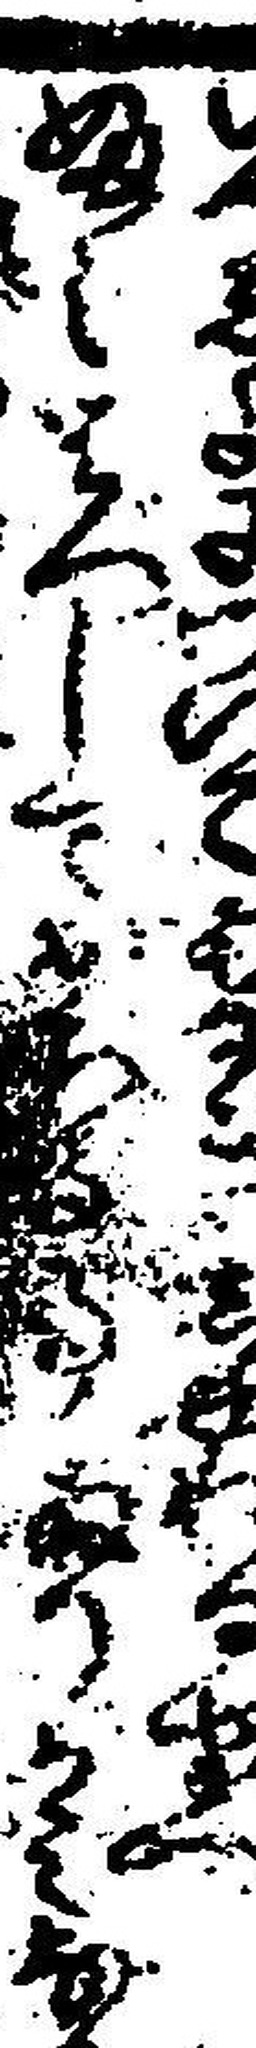ふみはづしておちる事ありかみなり
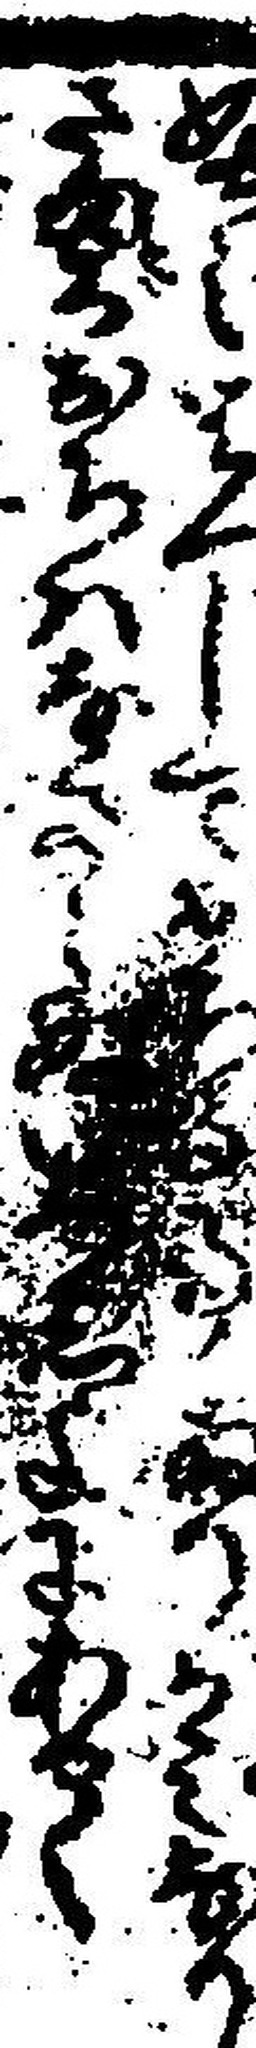さまがおちはなさらぬしよにあるく
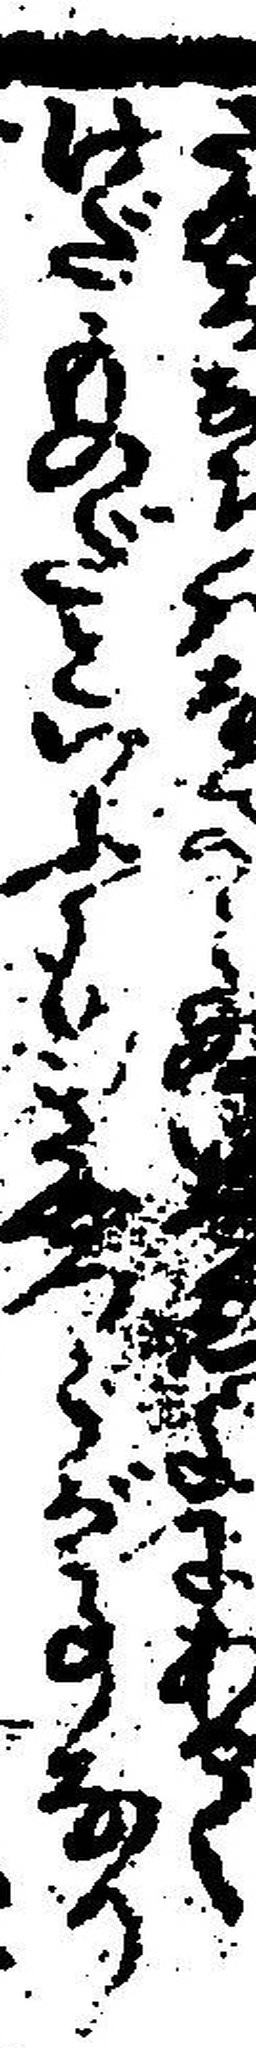けだものだといふもきやつらの事なり
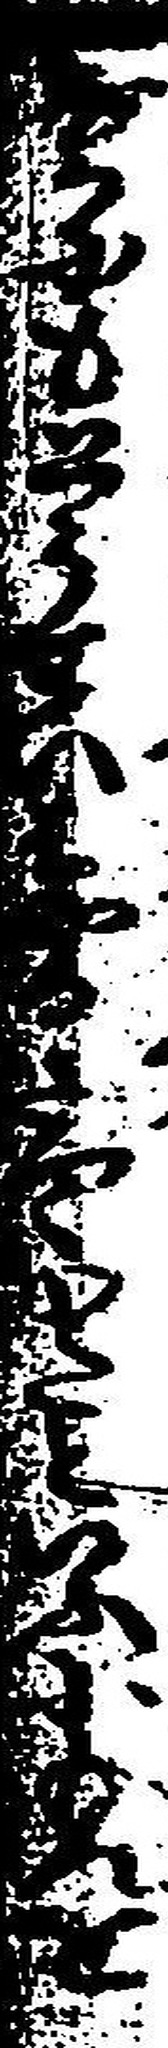なかにもとうせいはやるかたといふ小もんを
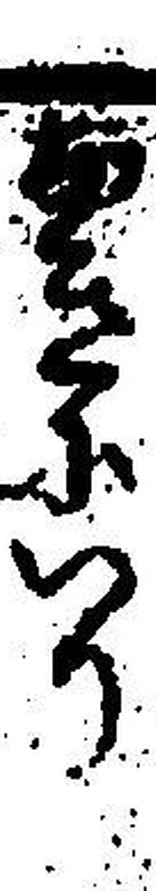おきにいり
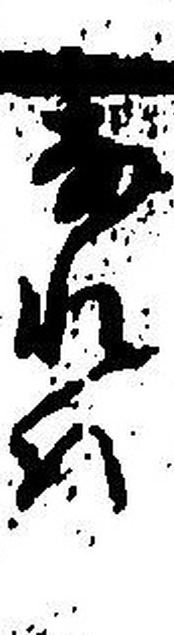なれは
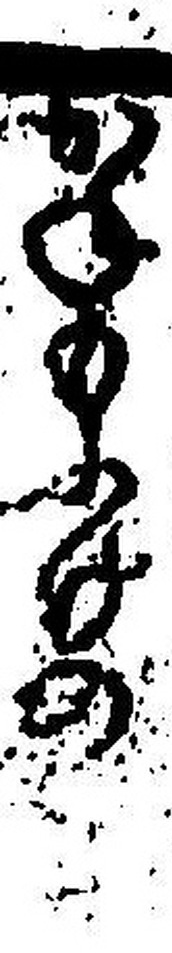かねもふけの
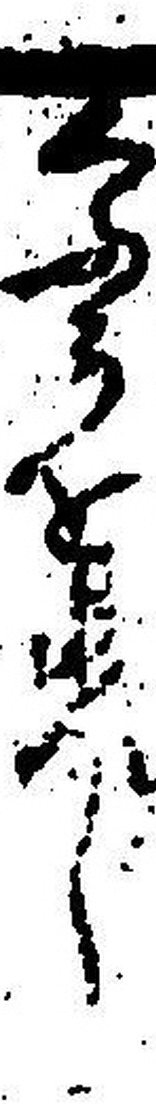くふうをあんじ
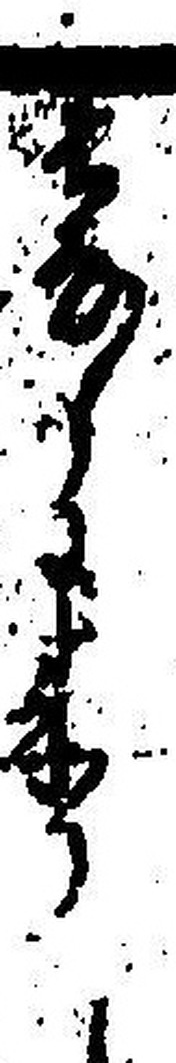はなしに来り
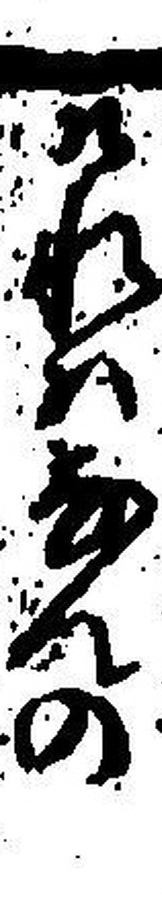けれはなんの
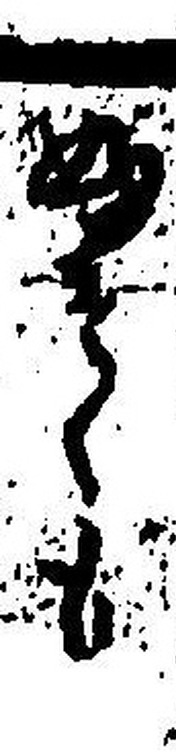ふそくも
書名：天竺儲之筋 / 市場通笑作
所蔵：東京大学総合図書館 General Library in the University of Tokyo, JAPAN
